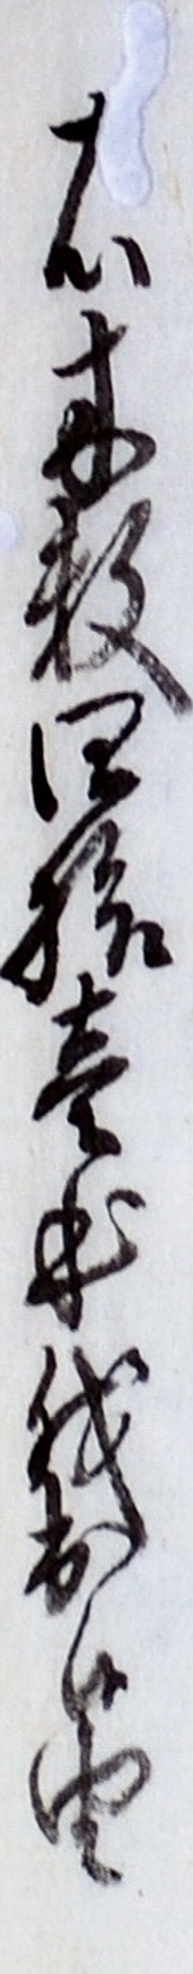右木数四拾壱本伐出候由
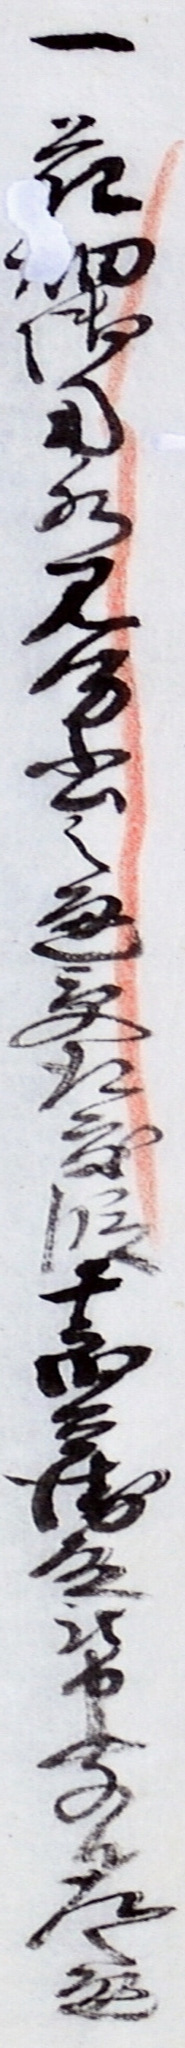一花細御用水見分不少之通受取度段十郎兵衛殿被申聞候左之通
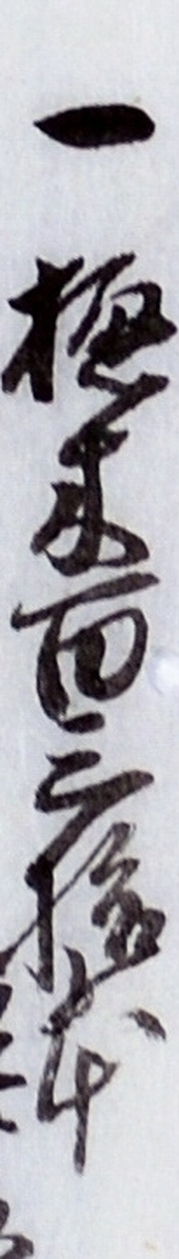一樋竹三拾本
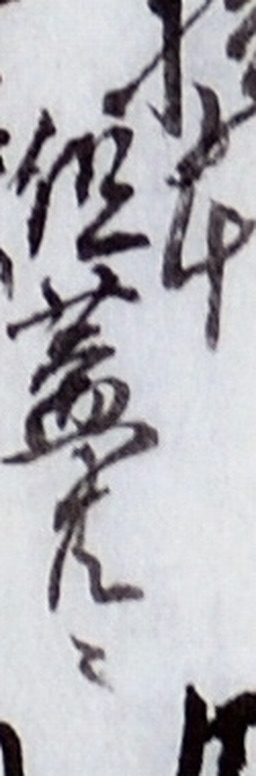但蓋共ニ
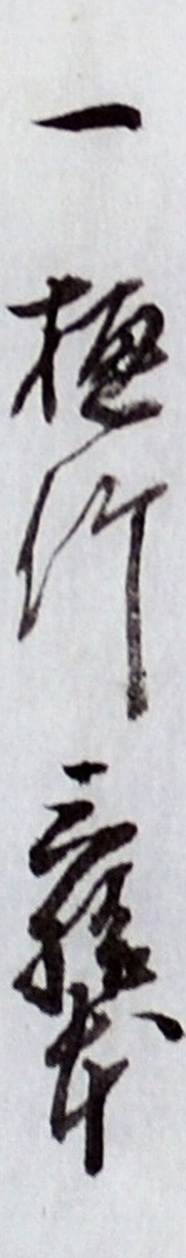一樋竹三拾本
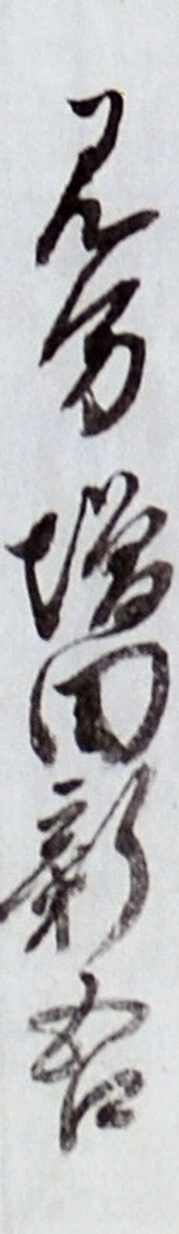見分増田新吾
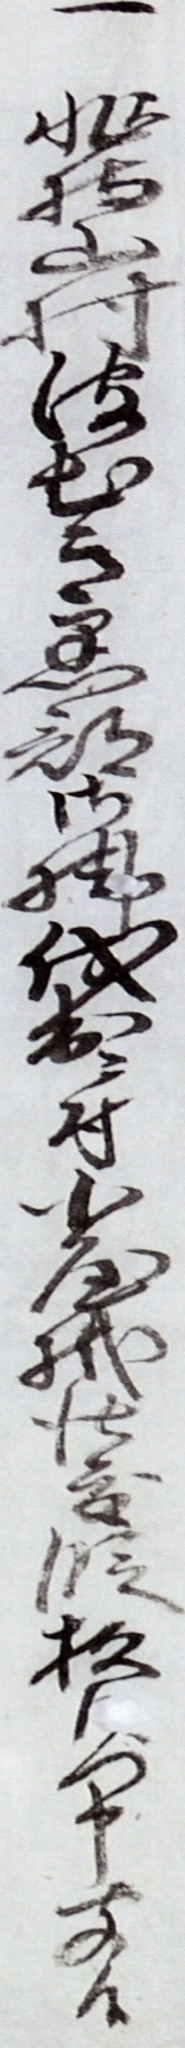一非持山村波む黒部御払伐出ニ付小屋掛仕度段杉左衛門申聞候
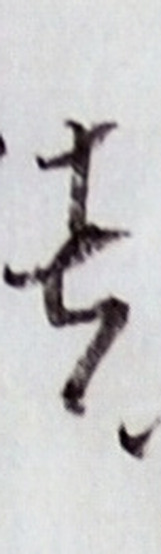十七日
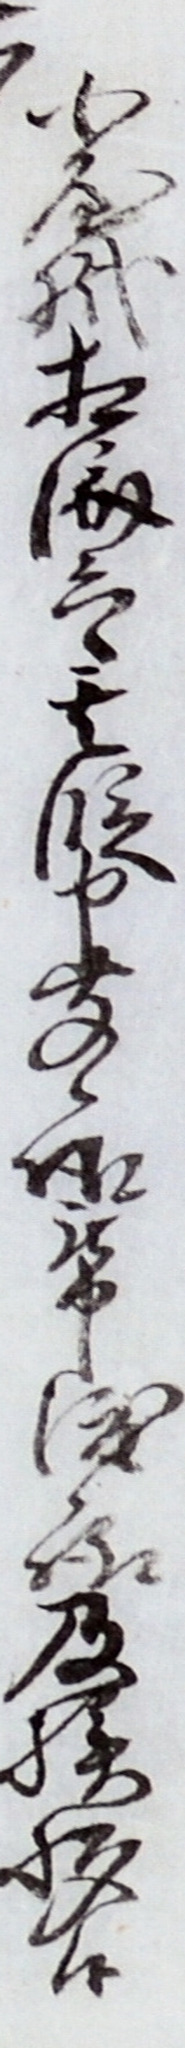小屋掛相済候はゝ其段申聞候様被申渡候様及挨拶候
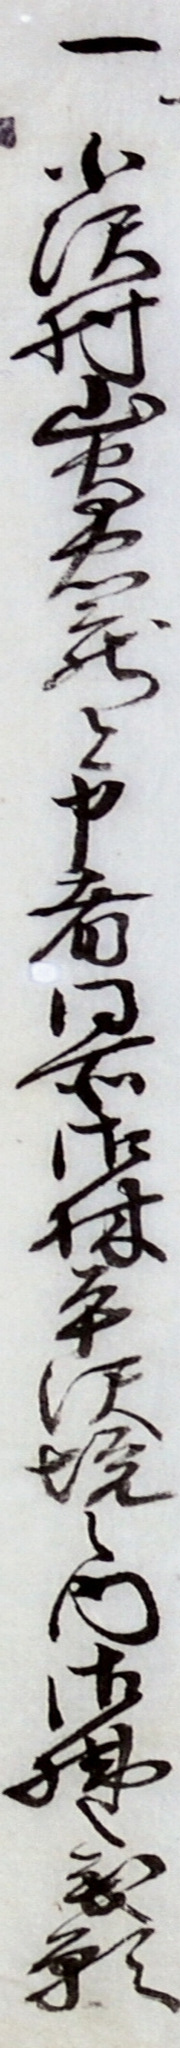一小沢村山守忠蔵と申者同所御林平沢境之内御払之義願

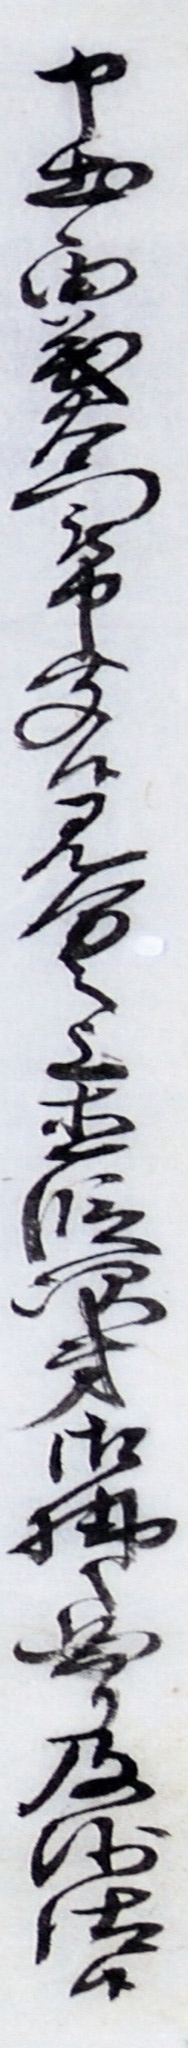申出候由義右衛門被申聞候見分之上直段次第御払之図り及沙汰候
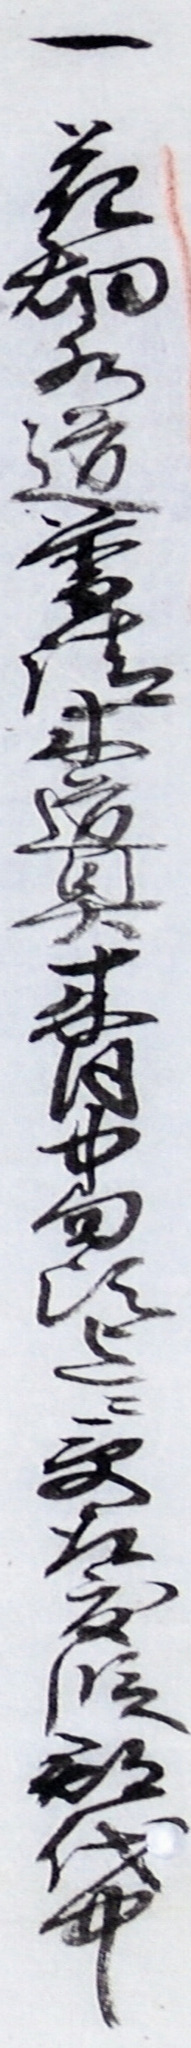一花畑水道普請木道具来月中旬頃迄に受取度段郡代中
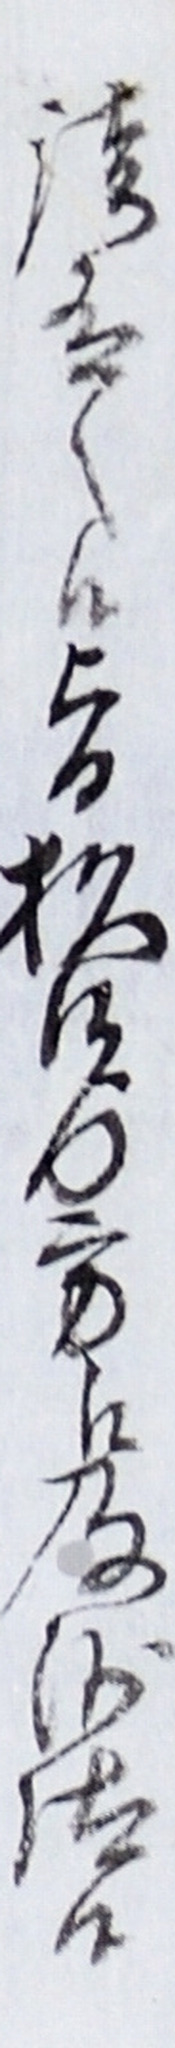談有之候旨杉沢右衛門方え及沙汰候
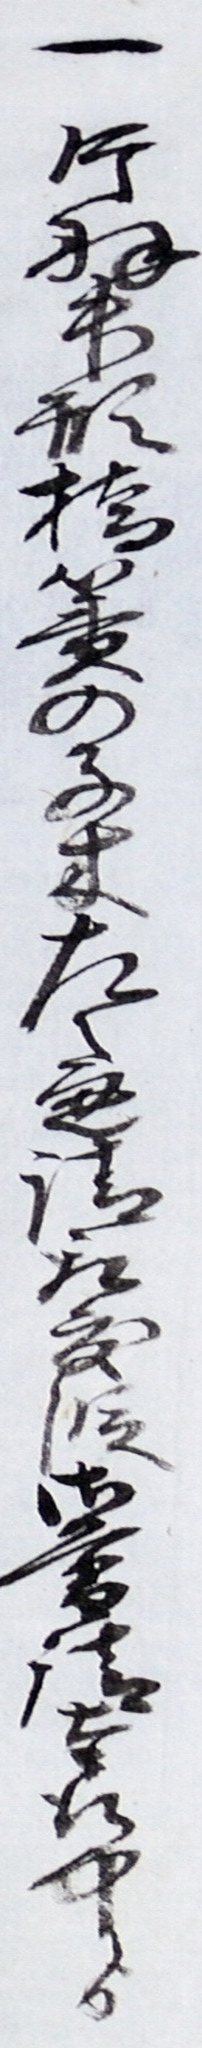一片羽末形橋簀の子来左之通請取度段御普請奉行中ゟ
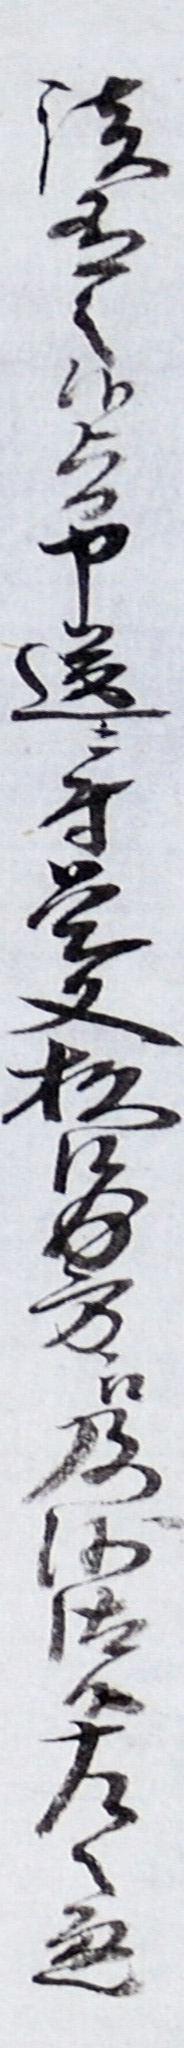一談有之候旨申送に付是又杉四郎方江及沙汰候左之通
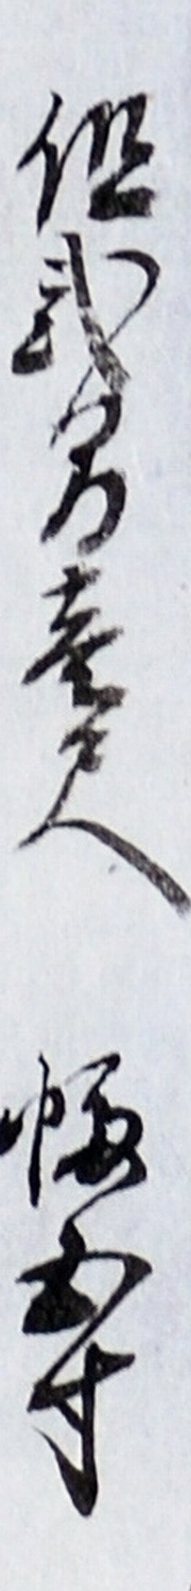但弐間壱尺幅五寸
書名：御山奉行御用控
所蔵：伊那市立高遠町図書館・合同会社AMANE
